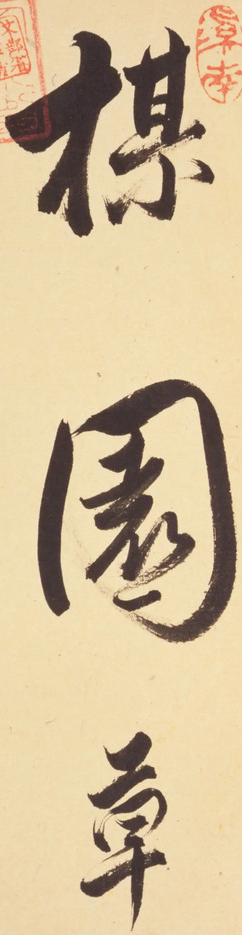梅園草
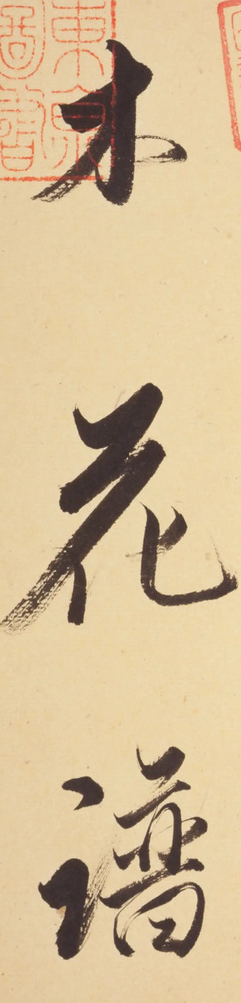木花譜
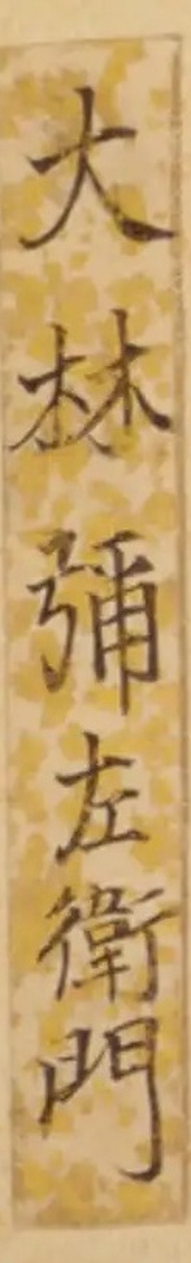大林弥左衛門

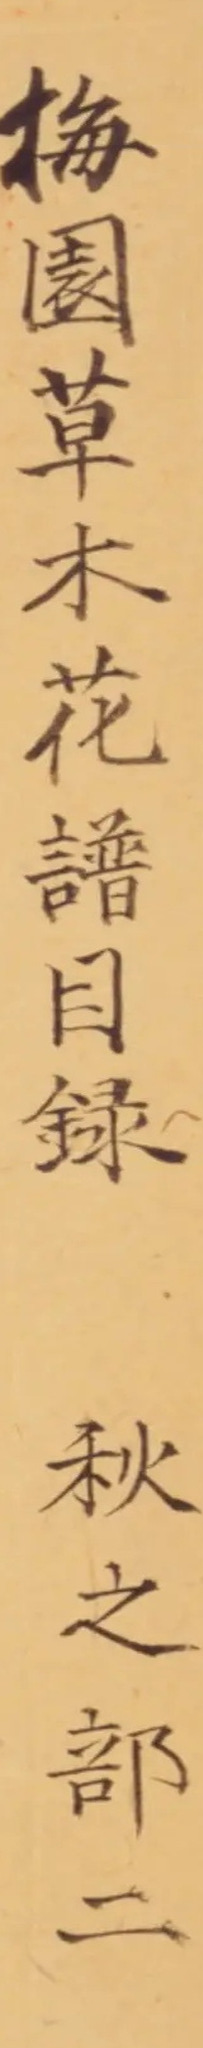梅園草木花譜目録秋之部二
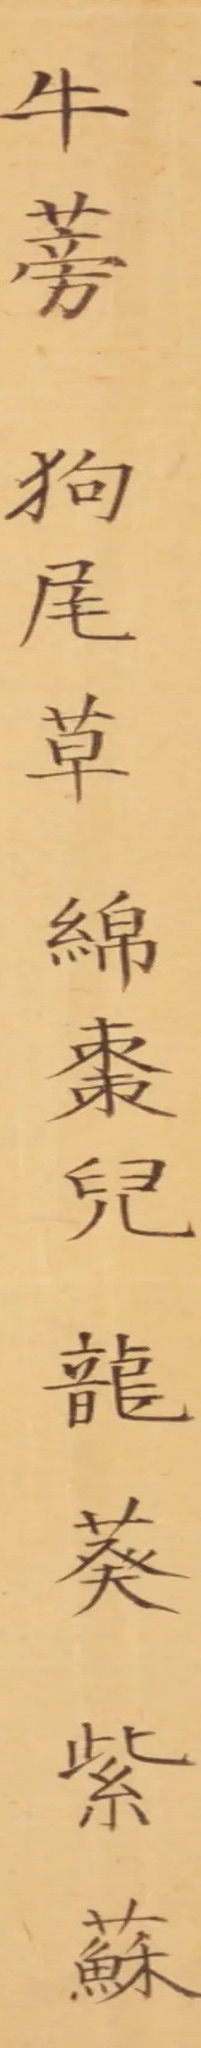牛蒡狗尾草綿棗児竜葵紫蘇
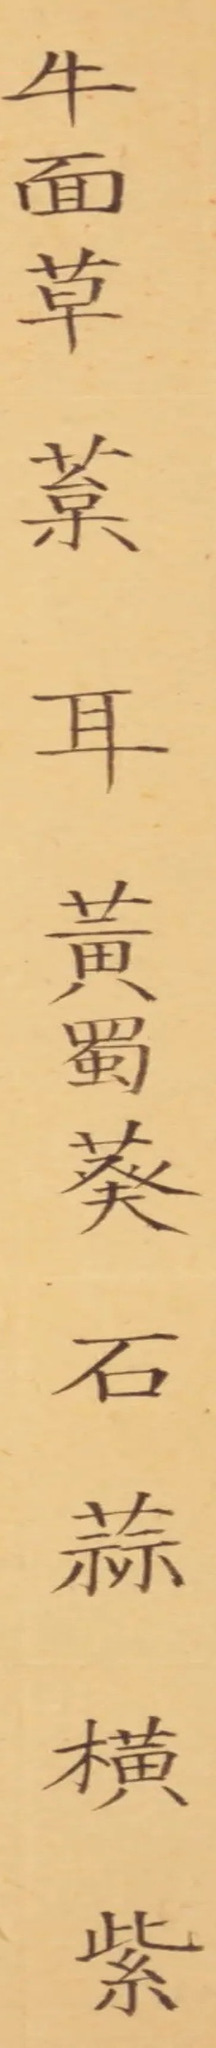牛面草葈耳黄蜀葵石蒜横紫
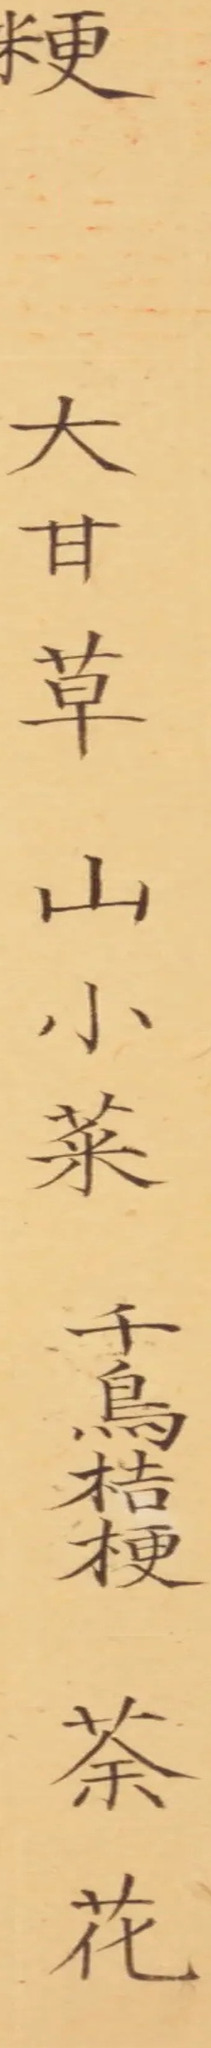粳大甘草山小菜千鳥桔梗荼花
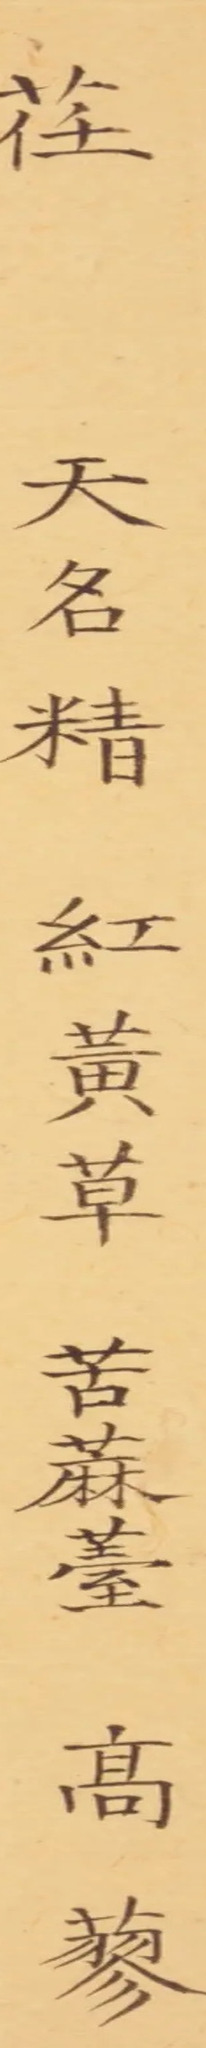荏天名精紅黄草苦麻薹高蓼
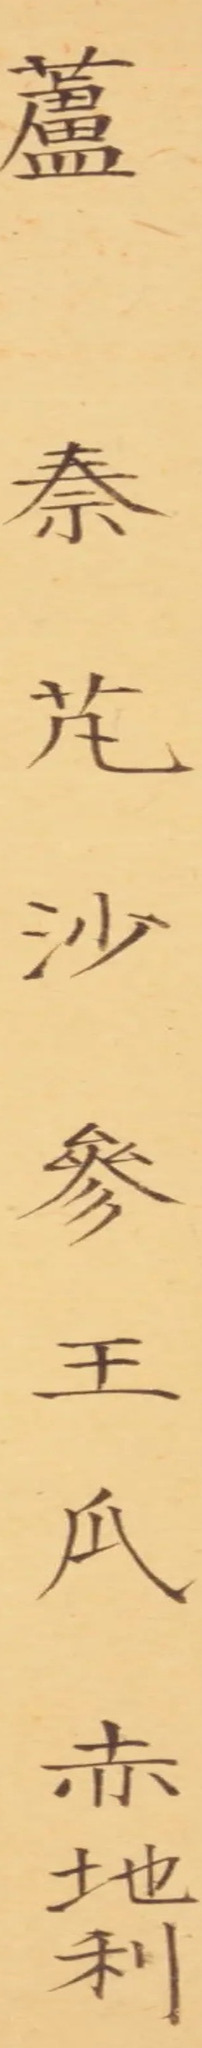芦秦芃沙参王瓜赤地利
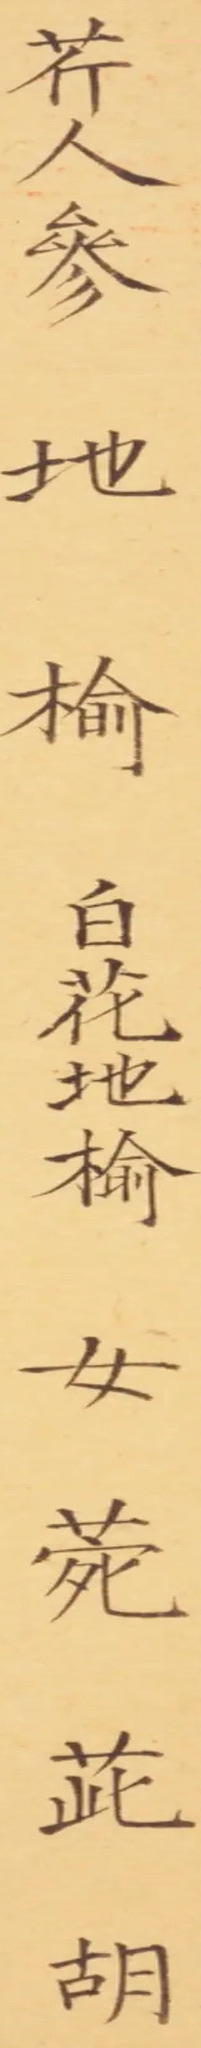芹人参地楡白花地楡女菀茈胡
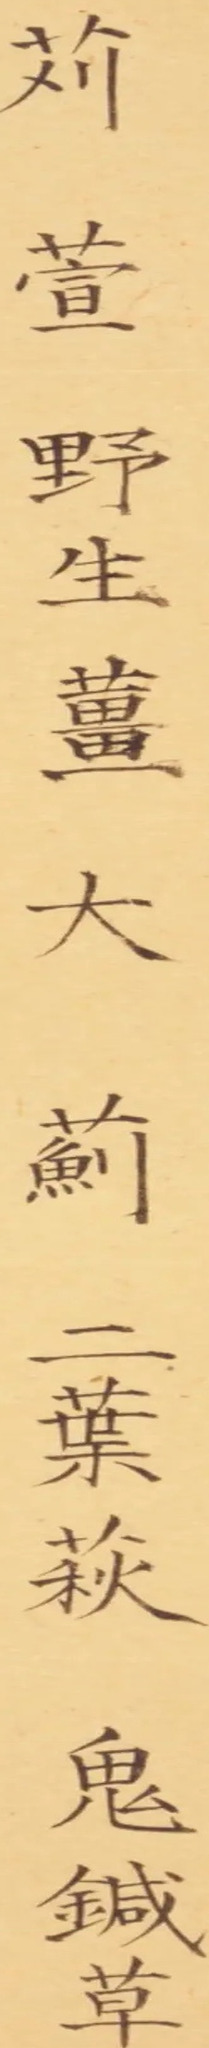苅萱野生薑大薊二葉萩鬼鍼草
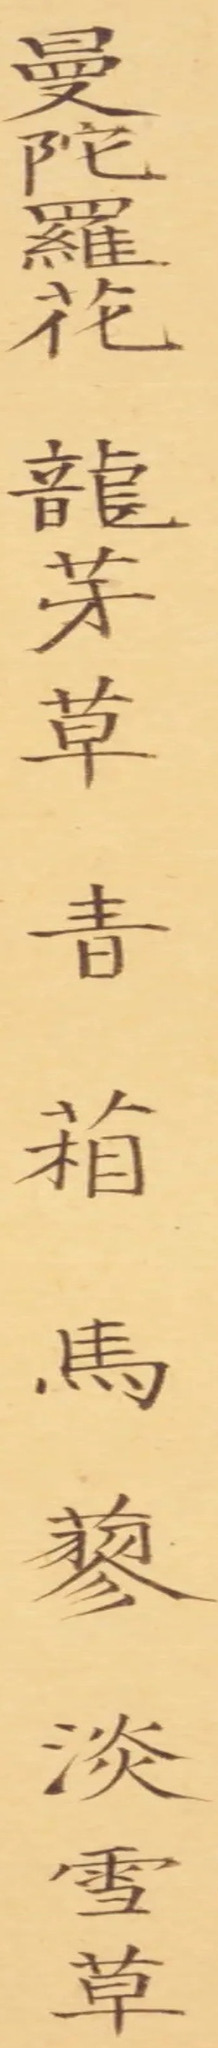曼陀羅花竜芽草青葙馬蓼淡雪草
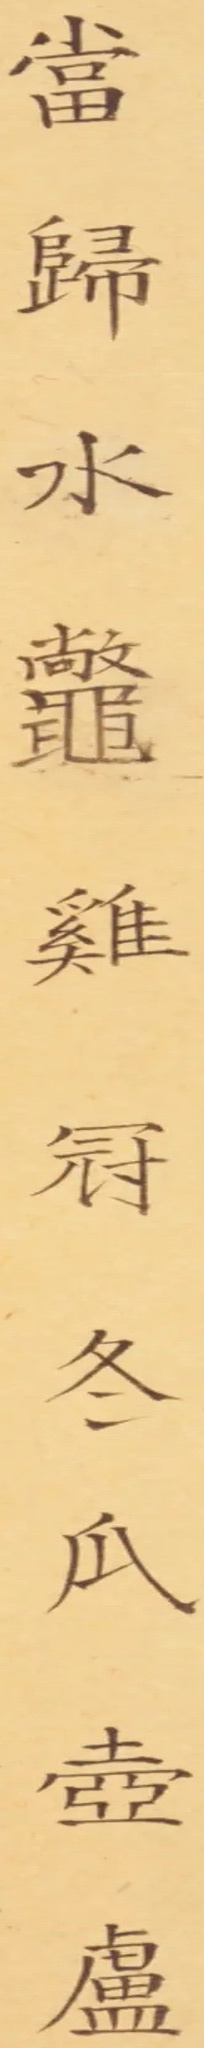当帰水鼈鶏冠冬瓜壺盧
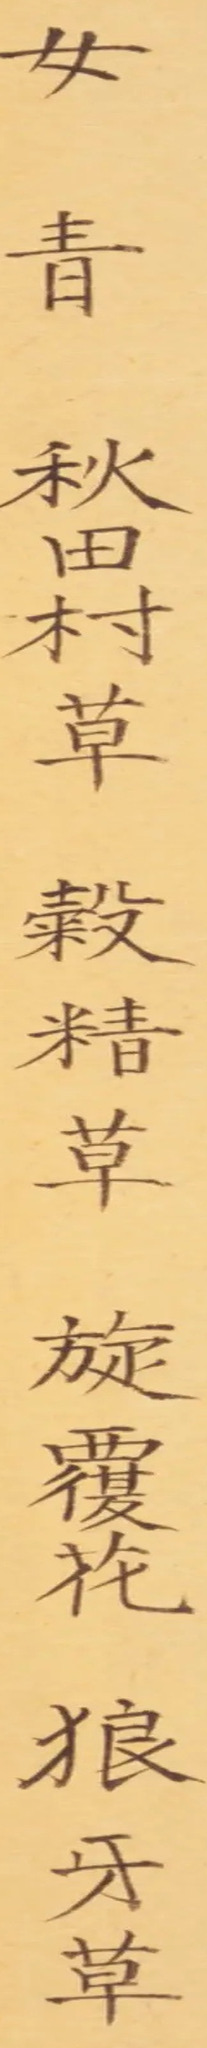女青秋田村草穀精草旋覆花狼牙草
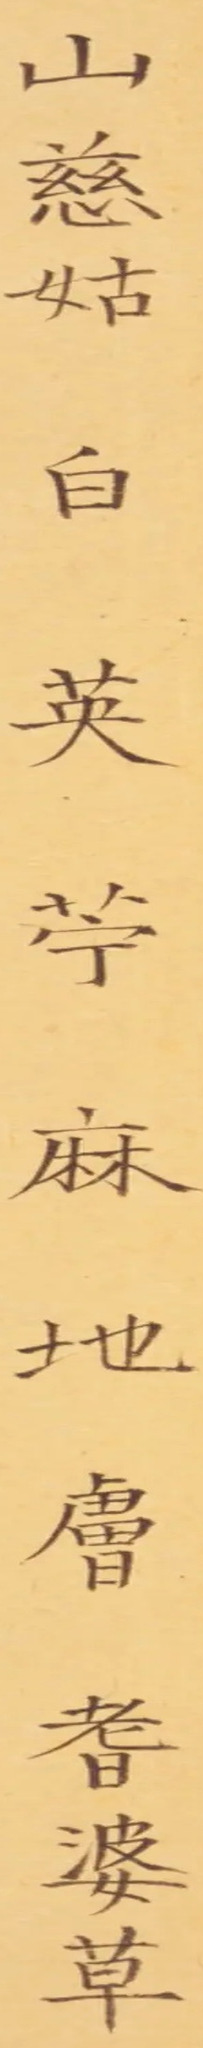山慈姑白英苧麻地膚耆婆草
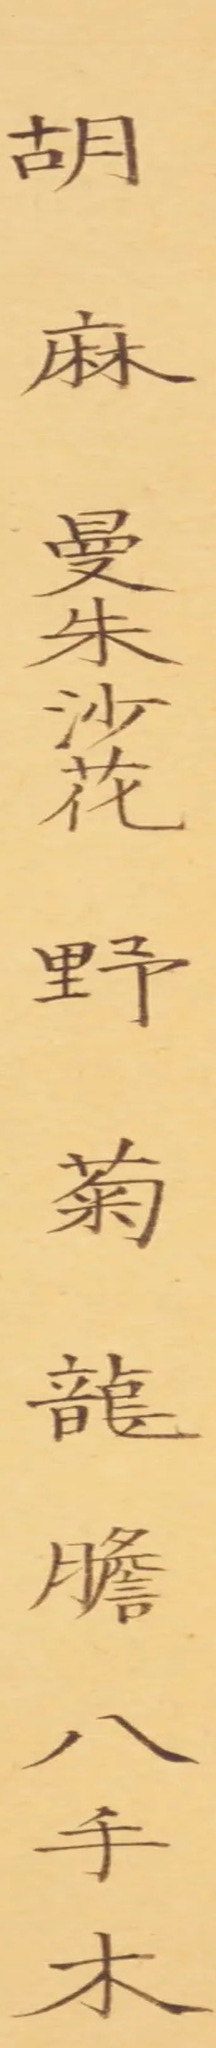胡麻曼朱沙花野菊竜胆八手木
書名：梅園草木花譜秋之部. 2
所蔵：国立国会図書館 National Diet Library, JAPAN
